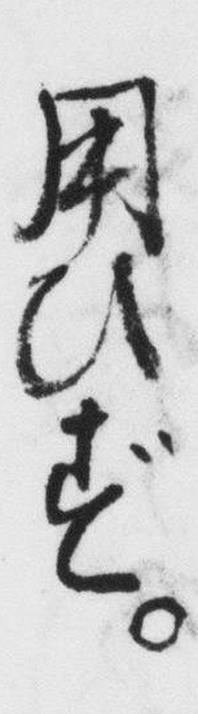用ひず。
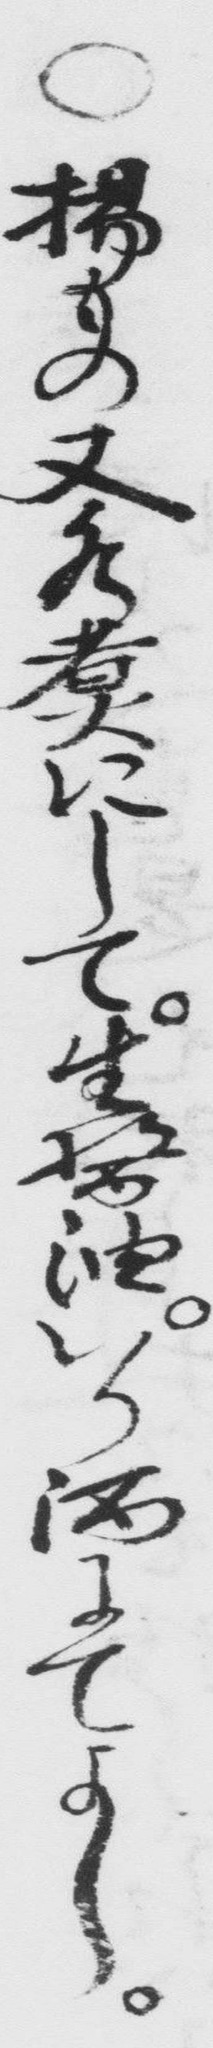○揚もの又水煮にして。生醤油。いり酒にてよし。
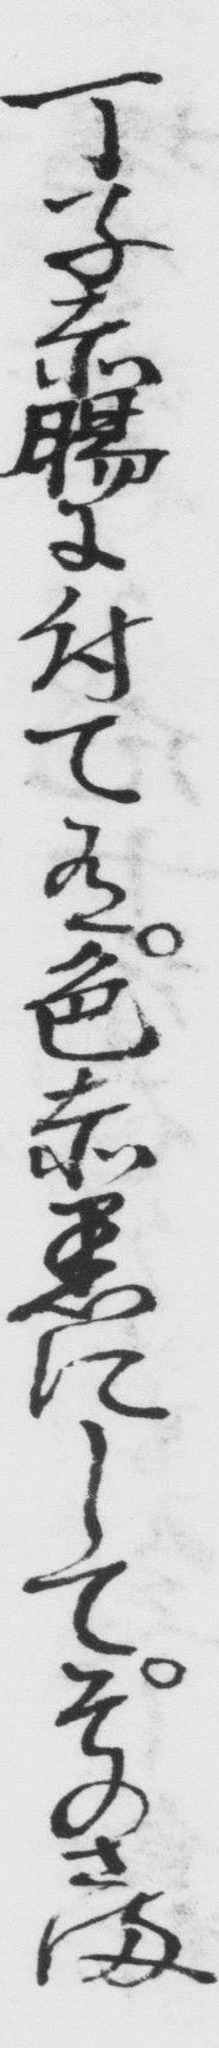血腸丁字赤腸に付て有。色赤黒にして。そのさま

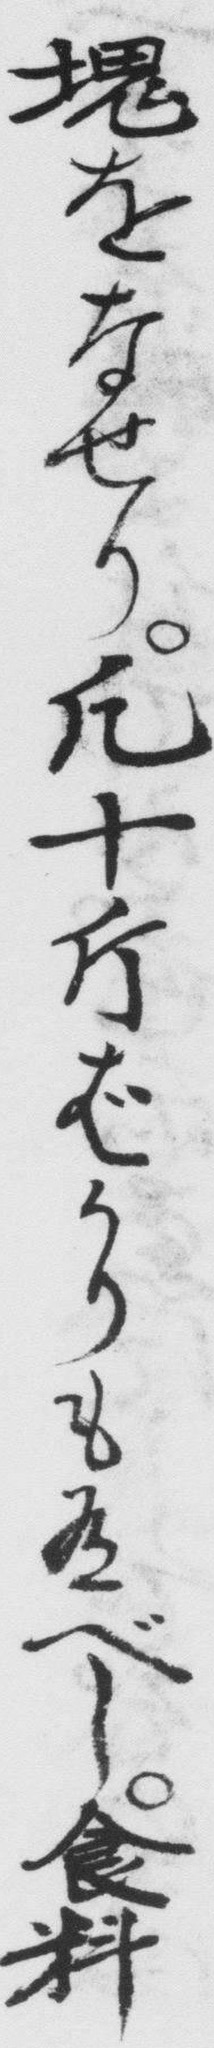塊をなせり。凡十斤ばかりも有べし。食料
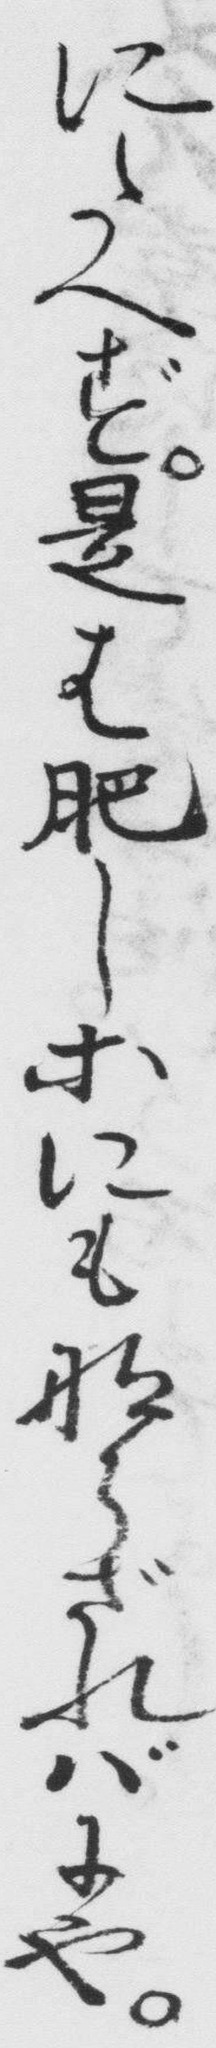にたへず。是は肥し等にもならざればにや。
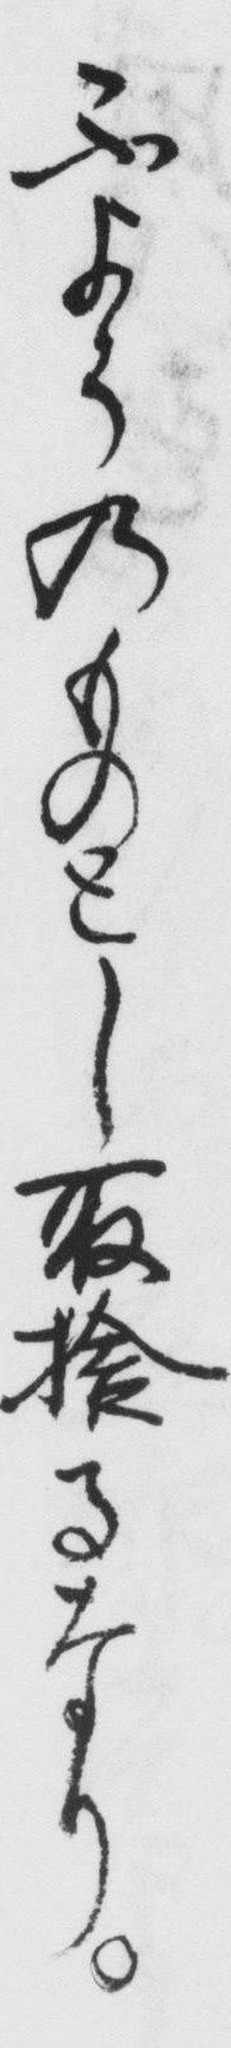ふようのものとし取捨るなり。
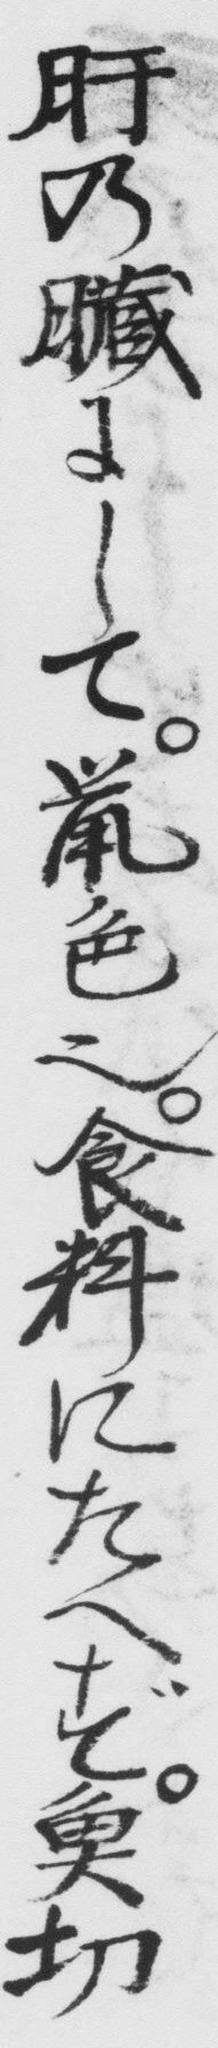殻膽肝の臓にして。鼠色也。食料にたへず。魚切
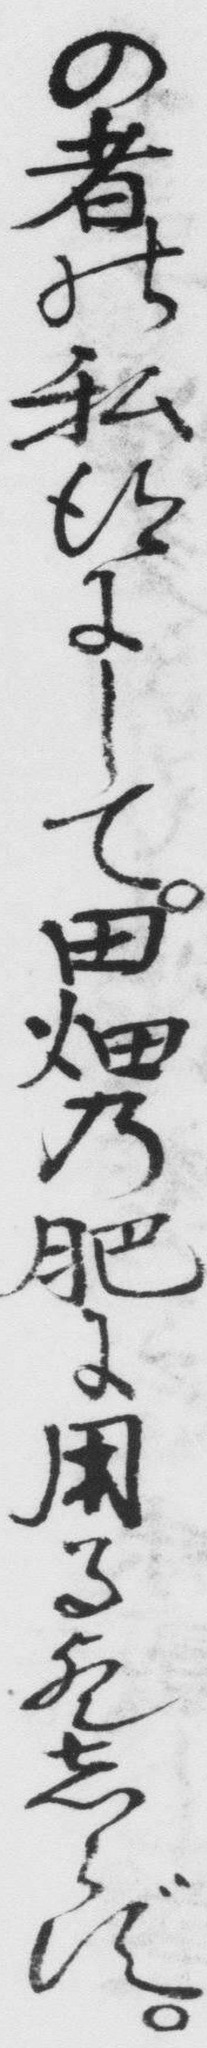の者の私得にして。田畑の肥に用る歟しらず。
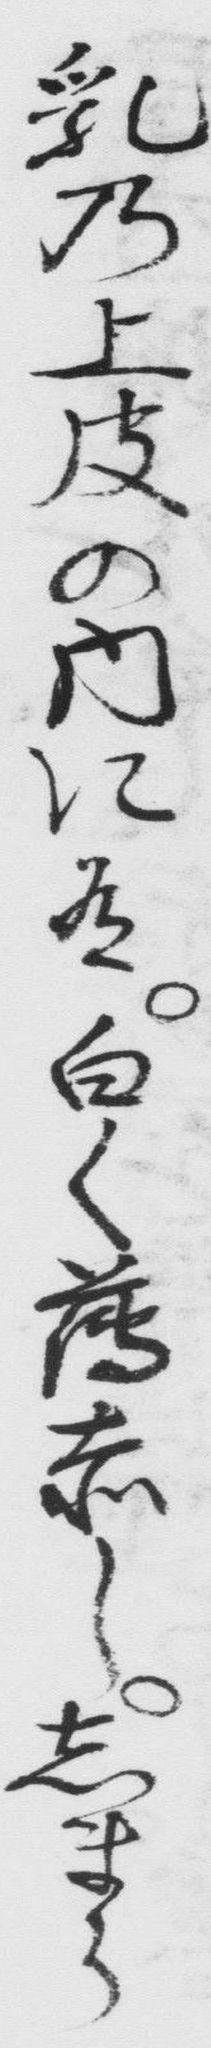乳腸乳の上皮の内に有。白く薄赤し。しまら
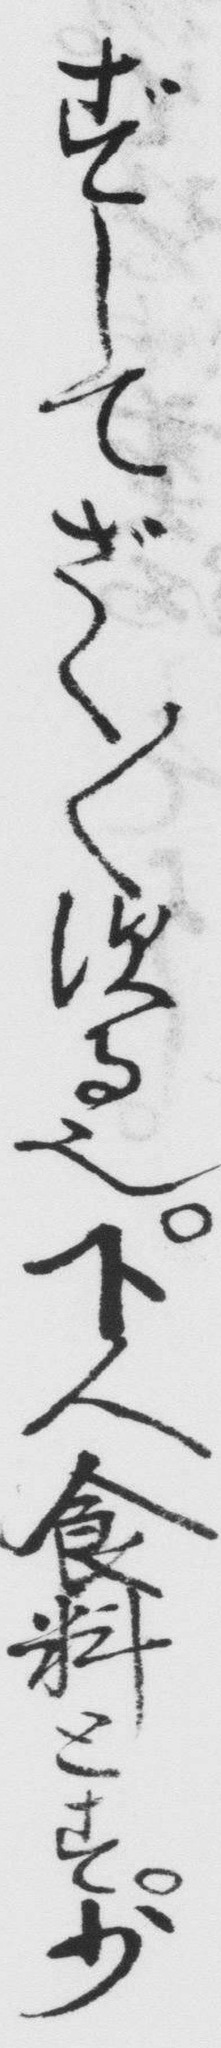ずしてざく〳〵する也。下人食料とす。少
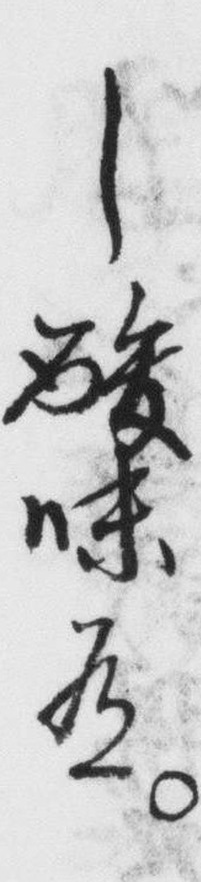し酸味有。
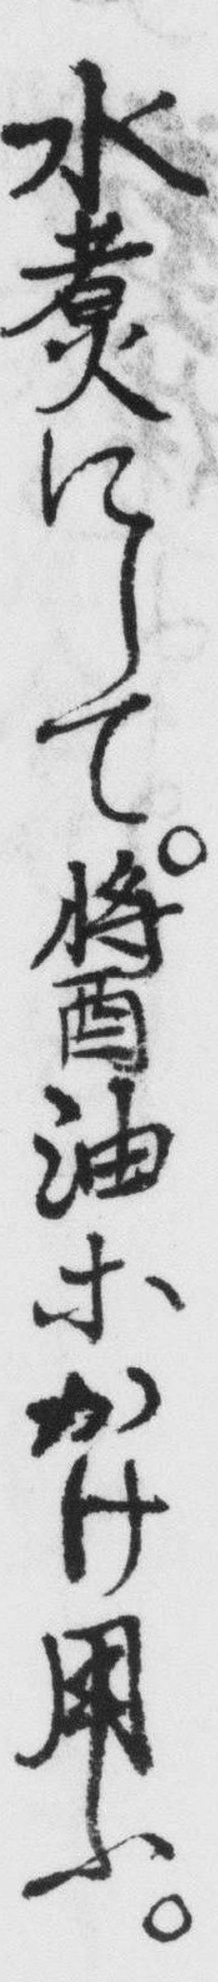○水煮にして。醤油等かけ用ふ。
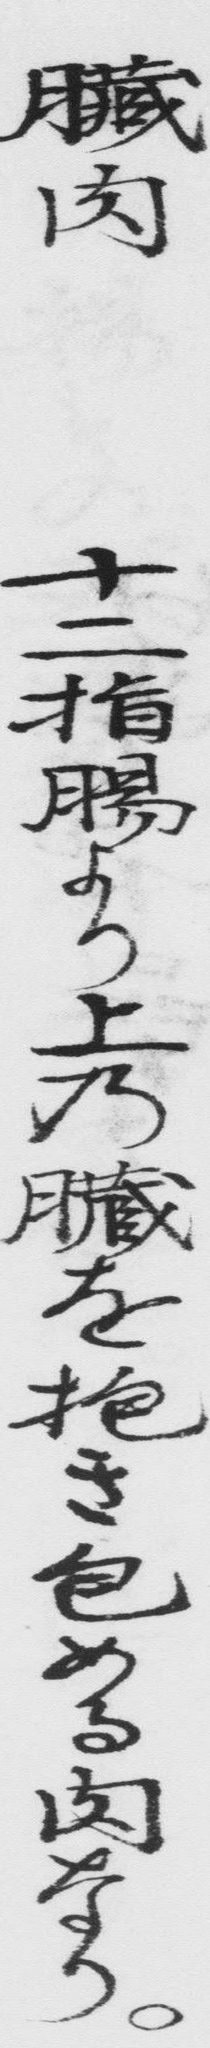臓肉十二指腸より上の臓を抱き包める肉なり。
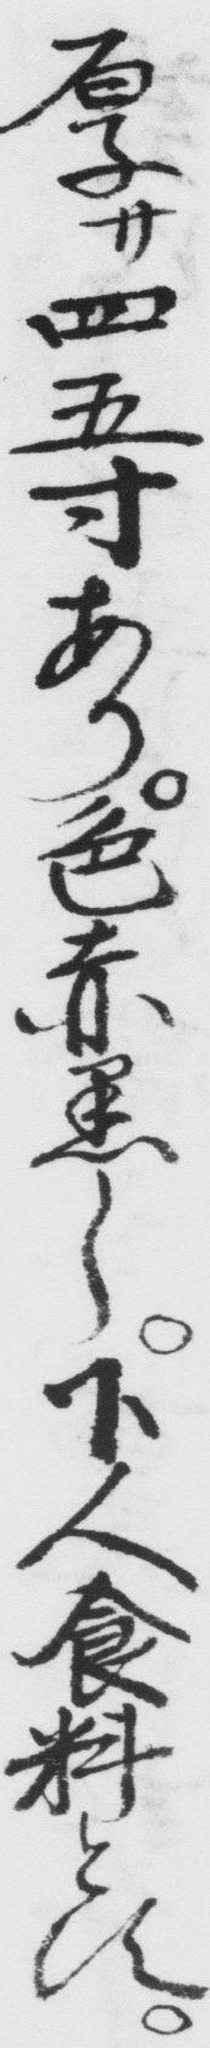厚サ四五寸あり。色赤黒し。下人食料とす。
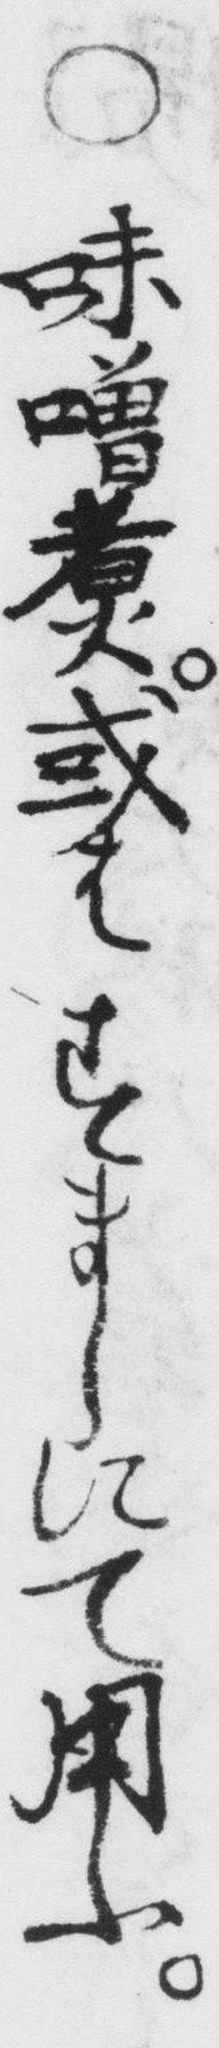○味噌煮。或はすましにて用ふ。
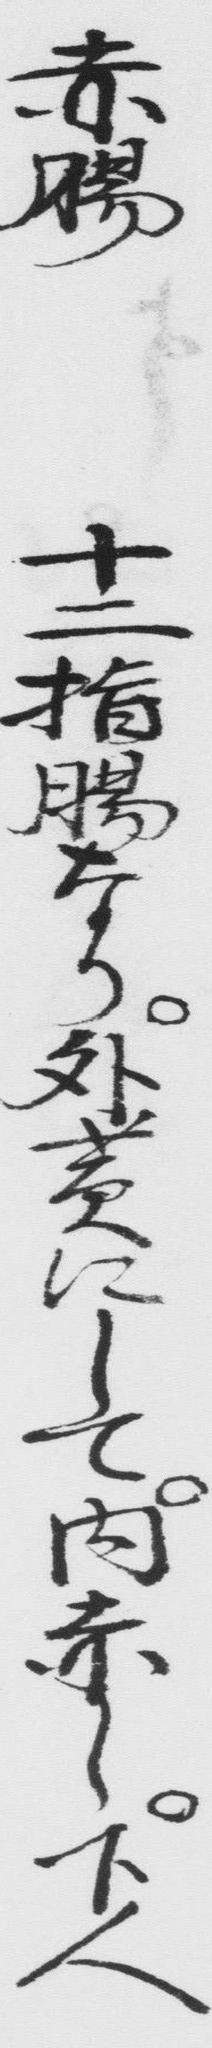赤腸十二指腸なり。外黄にして。内赤し。下人
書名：鯨肉調味方
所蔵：大阪府立大学学術情報センター 国文学研究資料館
